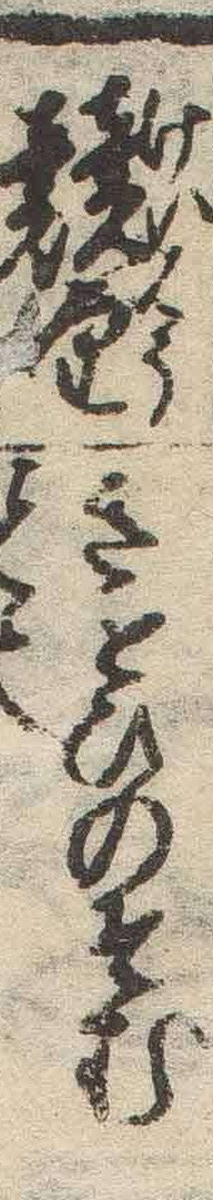競望きそひのそむ
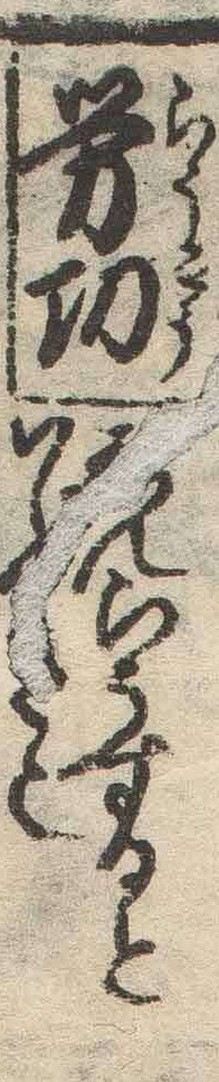労功しんらうすると
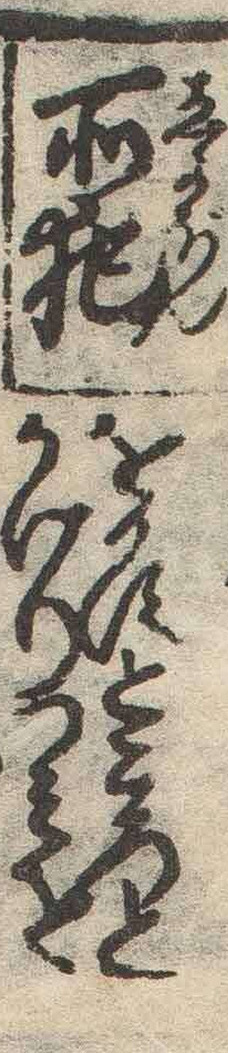所犯をかすところと
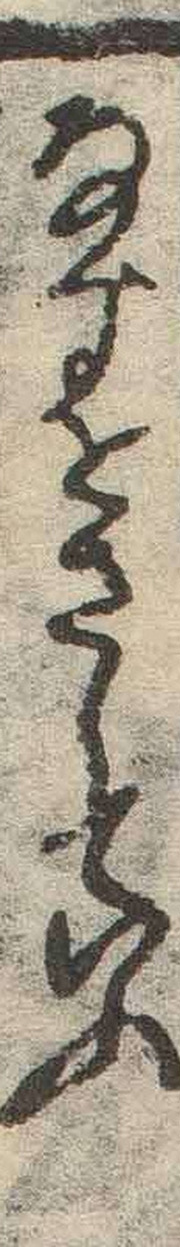なすをさしていふ
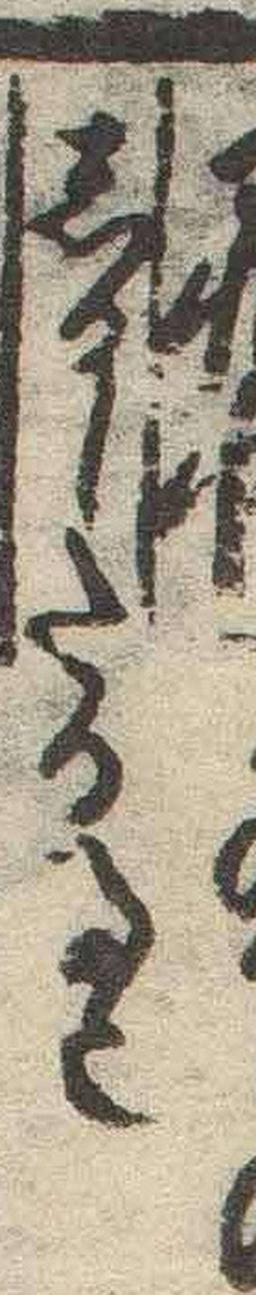しるしたる事也
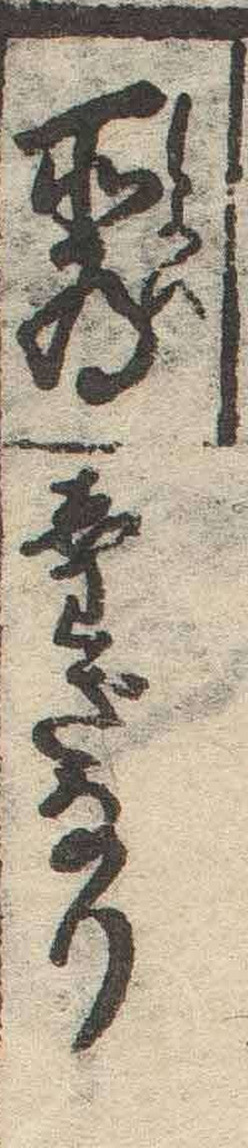所為しわざなり

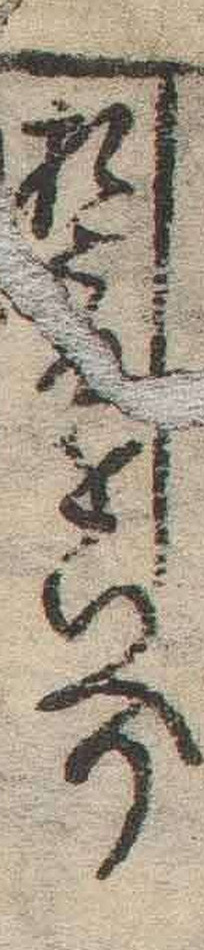おこるをいへり
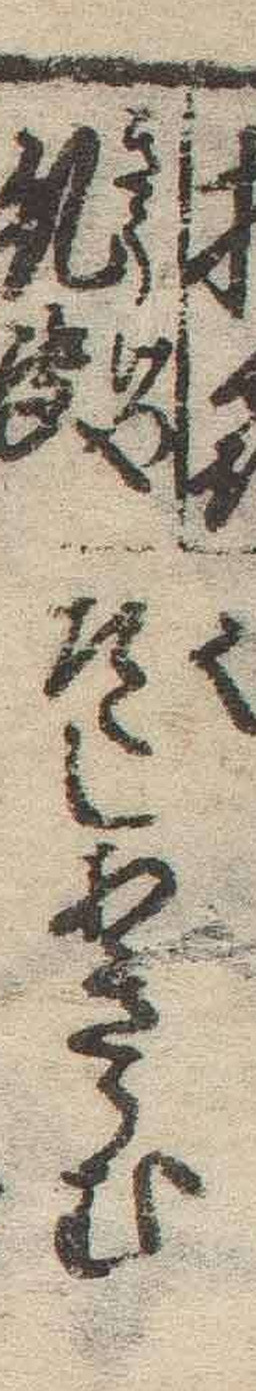糺決たゝしあきらむ
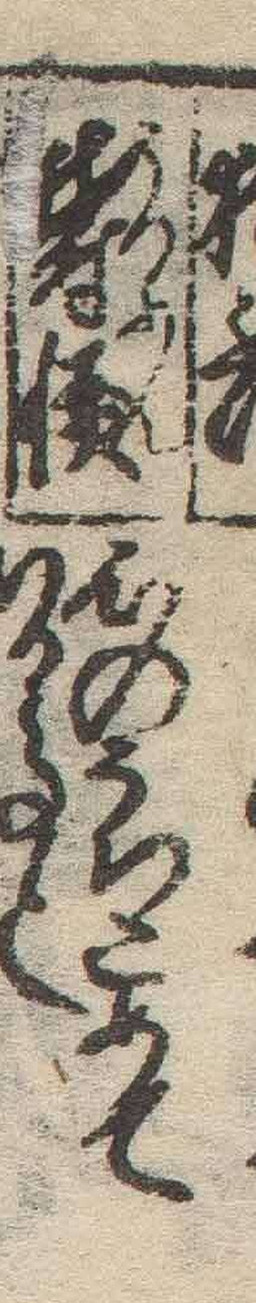鬱憤心のうちこめて
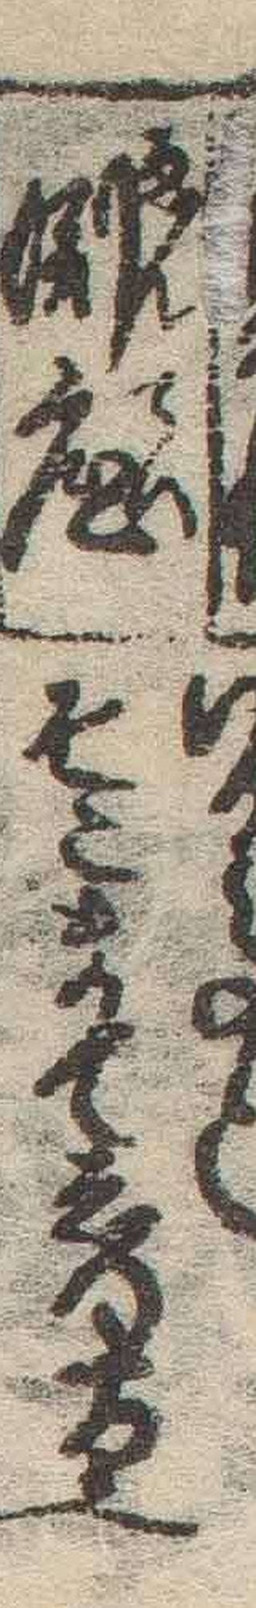渕底そこまてしる方也
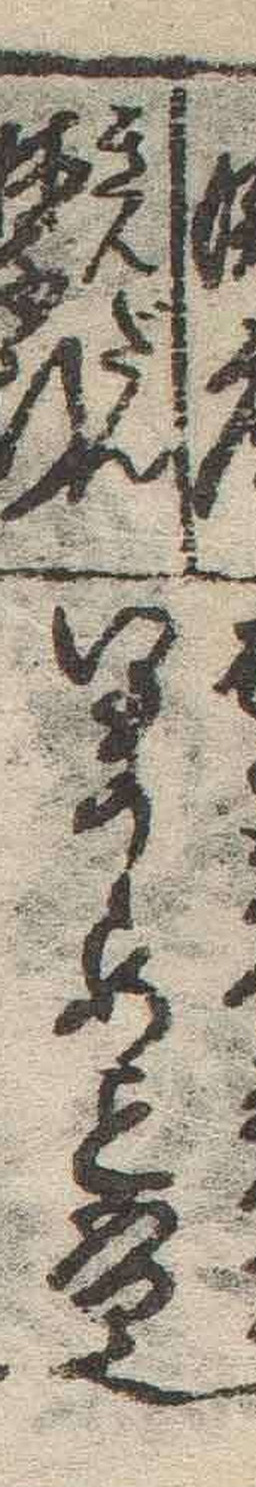禁断いましめことわる也
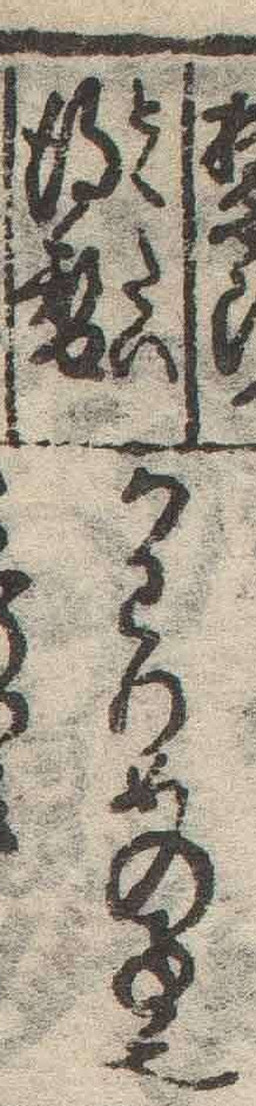得替かわりめの事也
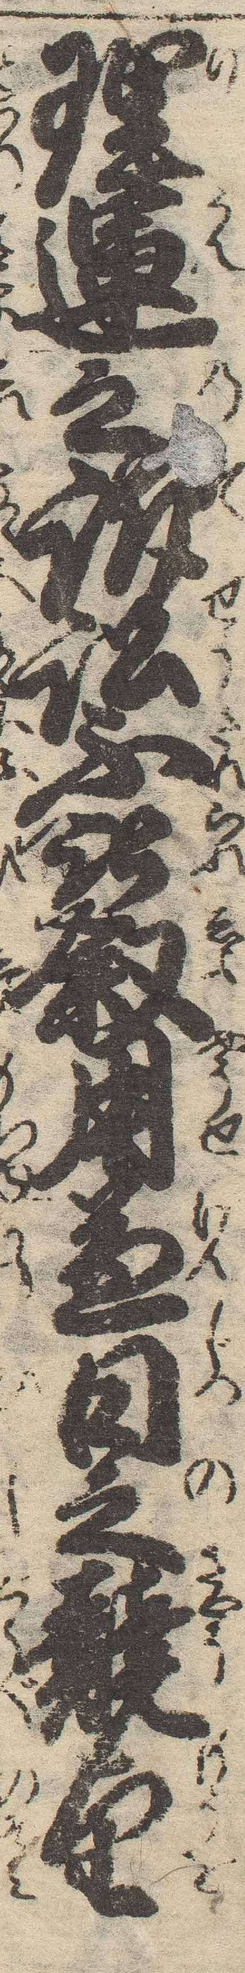理運之訴訟不被叙用兼日之競望
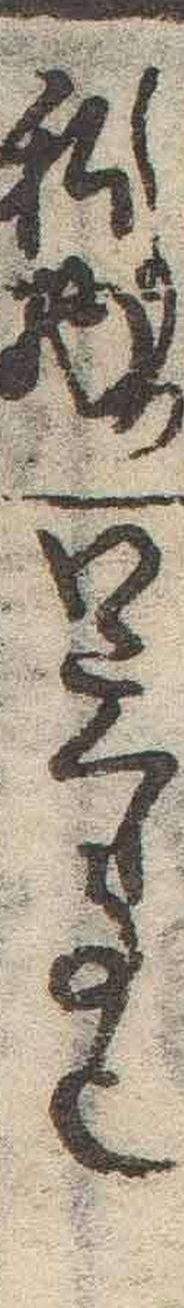私物わたくし事也
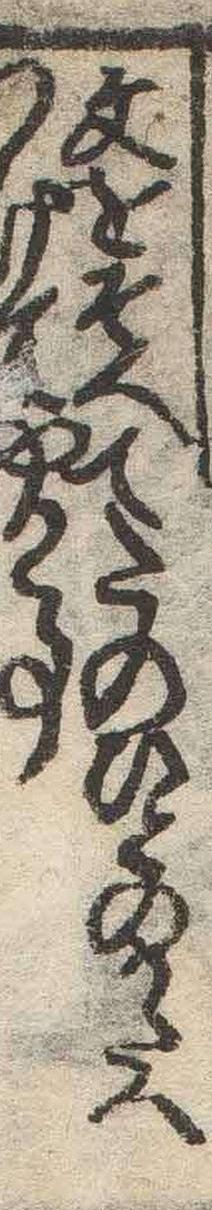文をそへてたのひとのかたへ
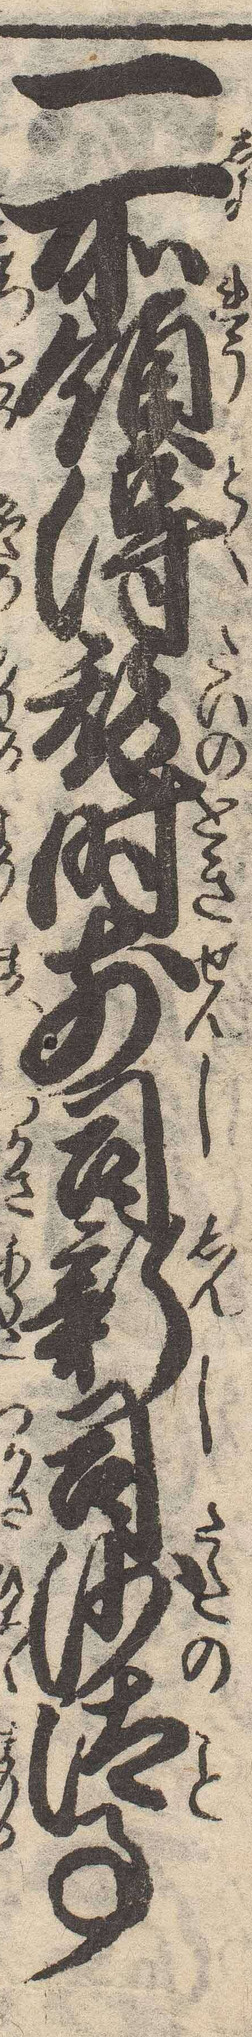一所領得替時前司新司沙汰事
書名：御成敗式目絵抄
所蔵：東京学芸大学附属図書館 国文学研究資料館
